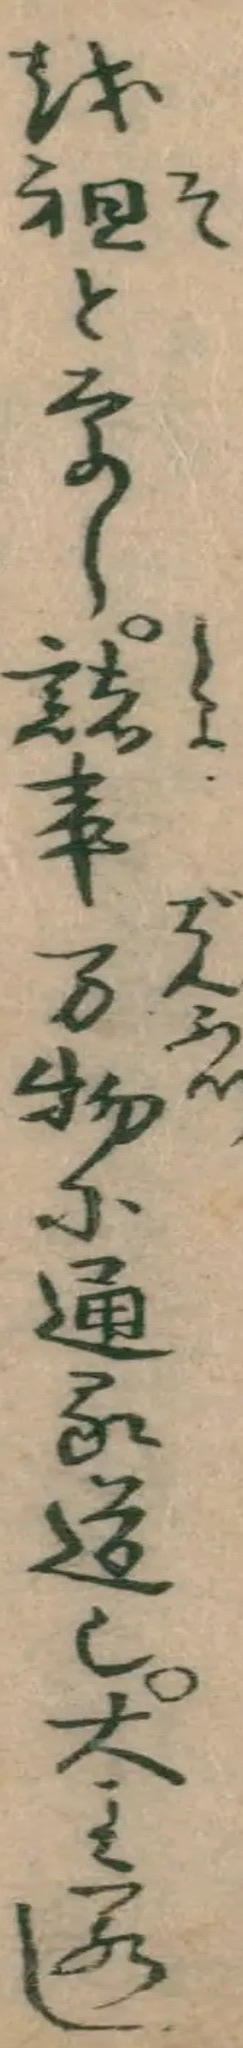を祖となし。諸事万物に通る道也。大王若し
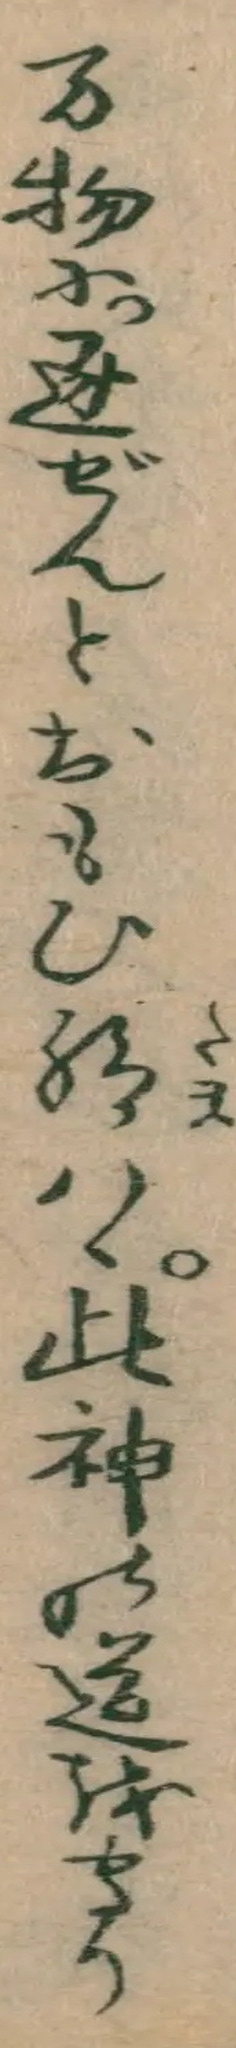万物に。通ぜんとおもひ給はゝ。此神の道を守り
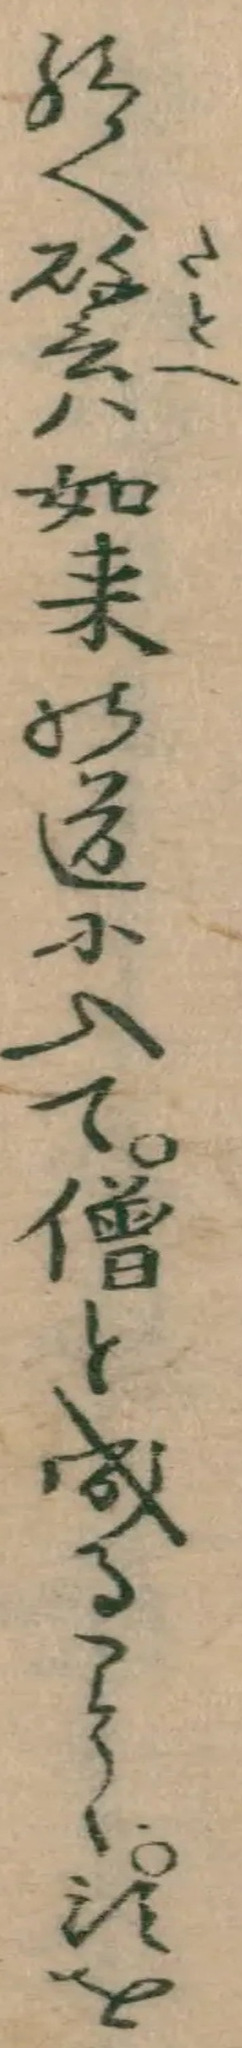給へ譬は如来の道に入て。僧と成ることく。頭を
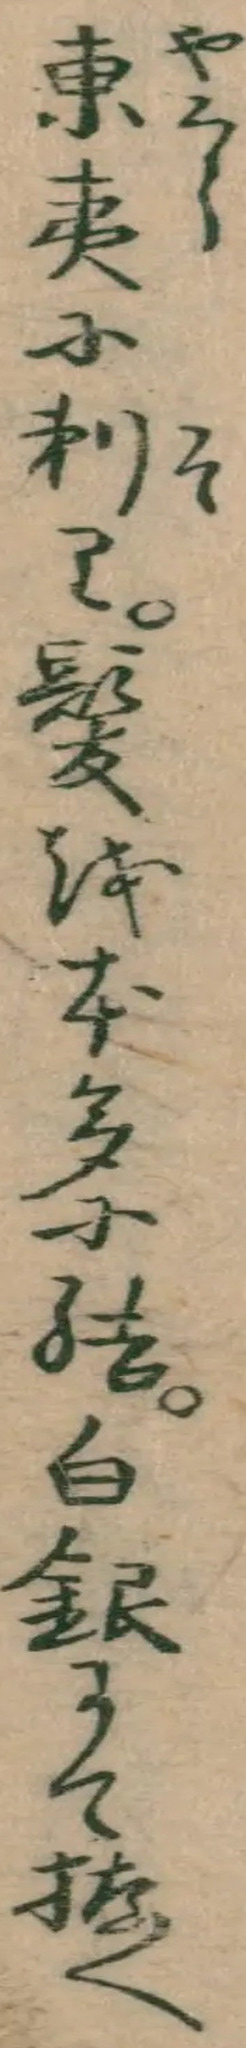東夷に剃り。髪を本多に結。白銀にて拵へ
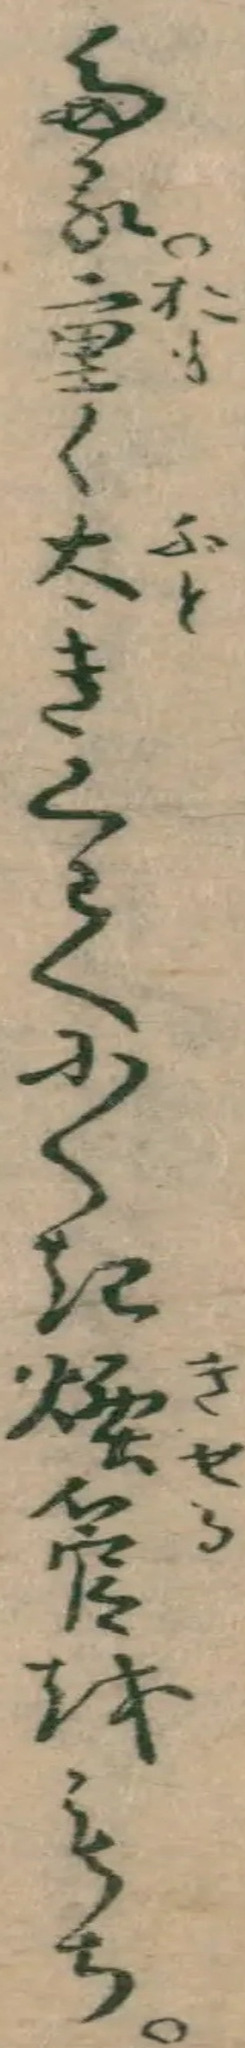たる。重く太きくわへにくき煙管をもち。
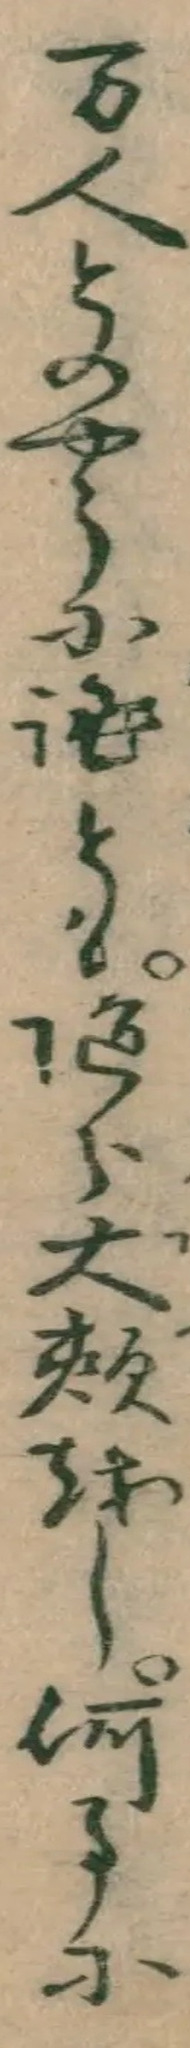万人とのやうに誹とも。随分大頬竦し。何事に
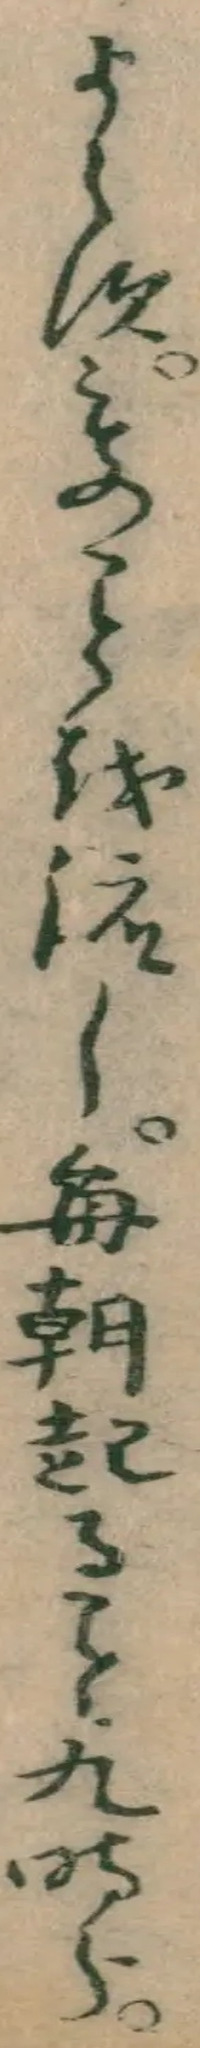よらす。ものことを流し。毎朝起ること九時分。
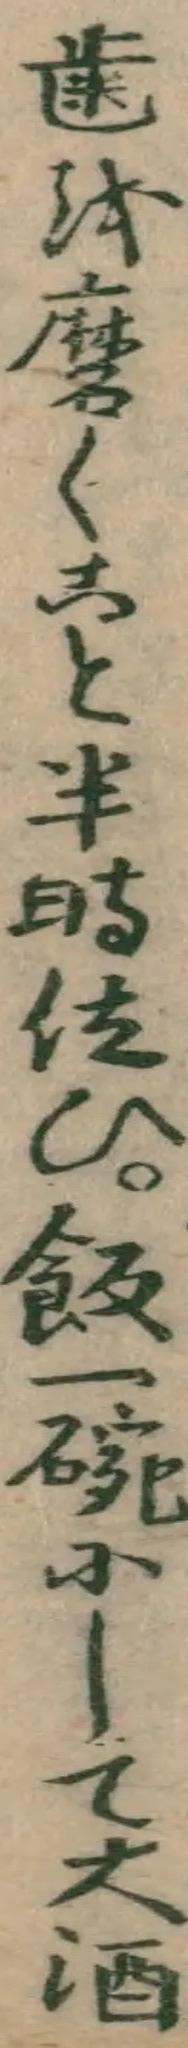歯を磨くこと半時位ひ。飯一椀にして大酒
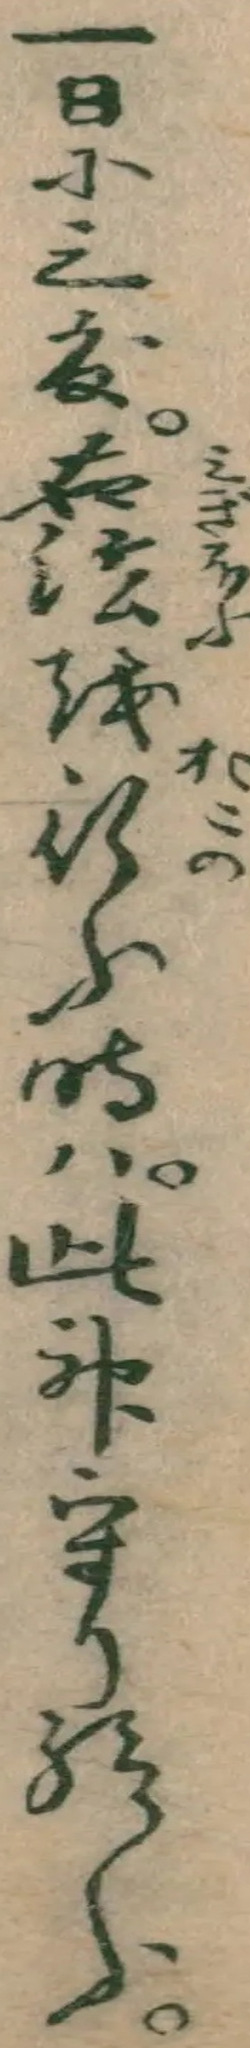一日に三度。右法を行時は。此神守り給ふ。
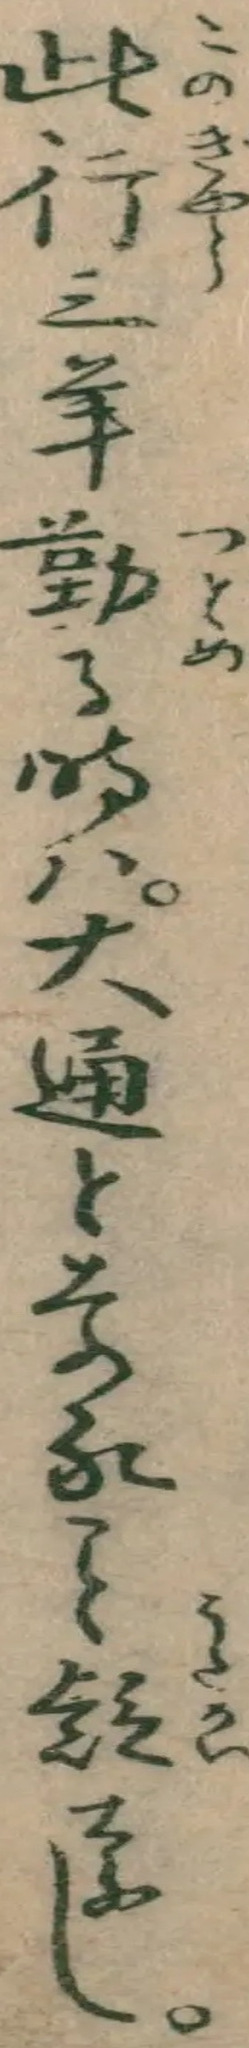此行三年勤る時は。大通となること疑なし。
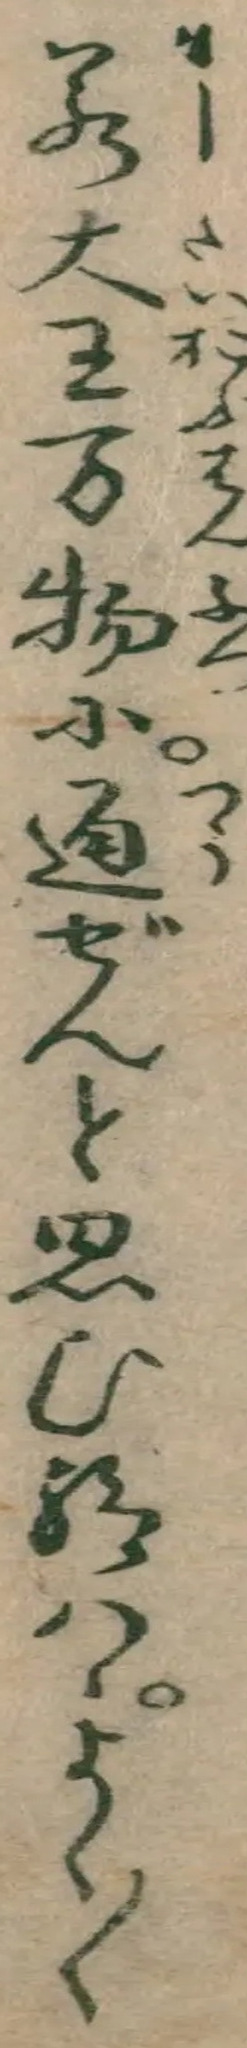若大王万物に。通ぜんと思ひ給はゝ。よく〳〵
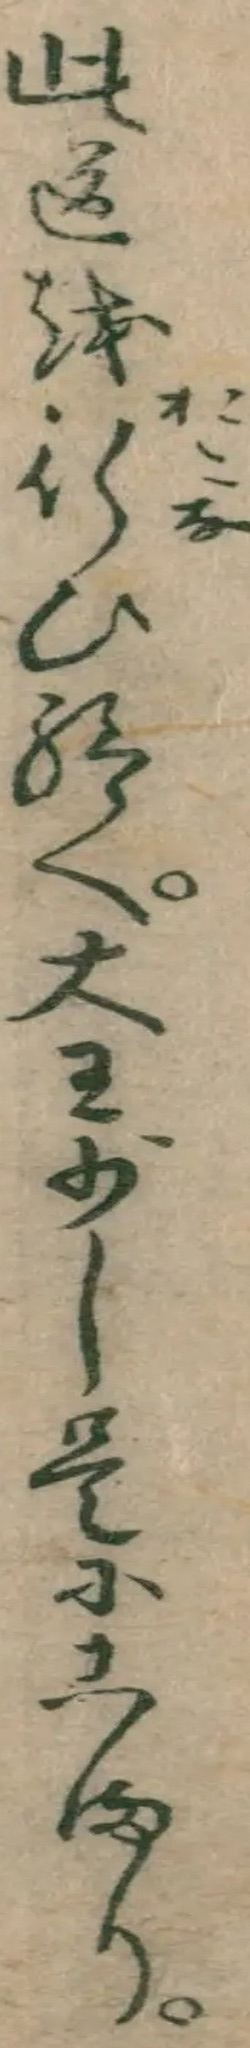此道を行ひ給へ。大王少し是にこまり。

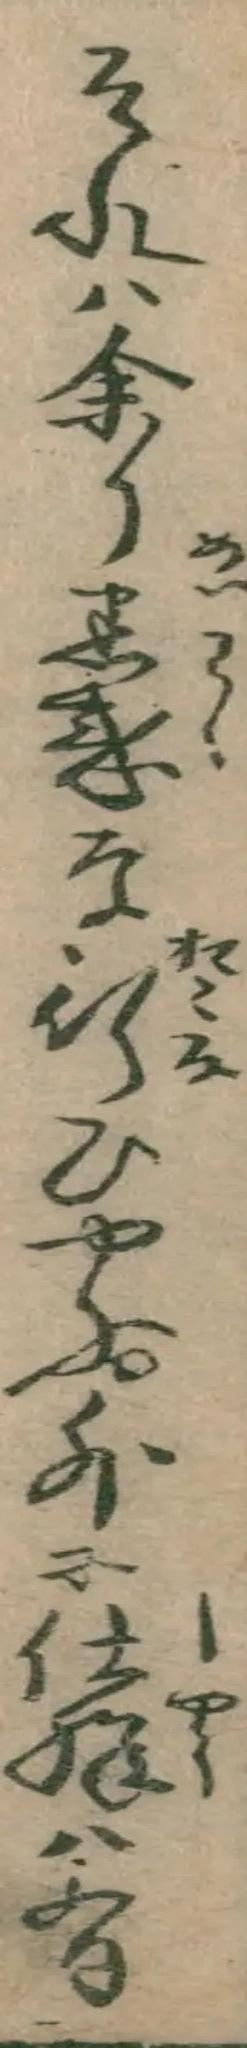それは余り迷惑な行ひやふ。外に仕様は有
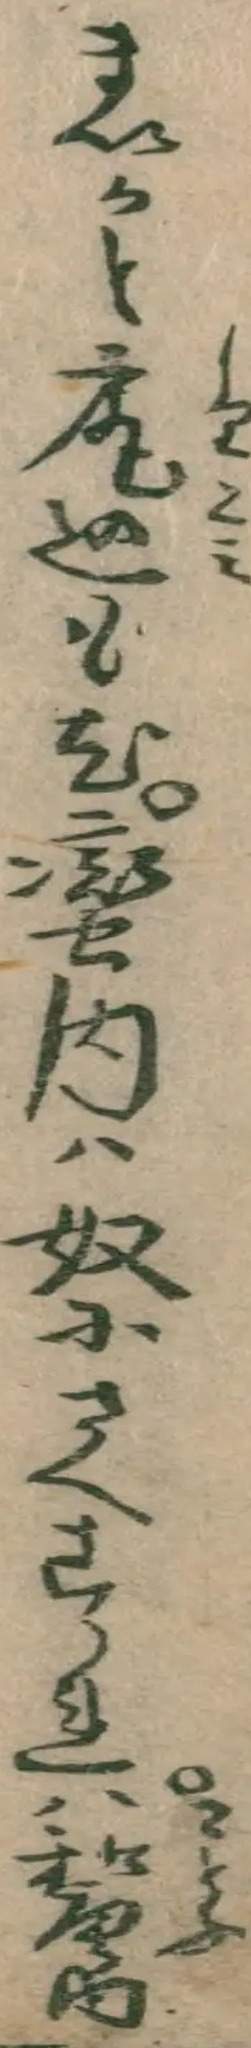まいかと尻込も尤。蛮内は奴にさへすかれは。和唐内
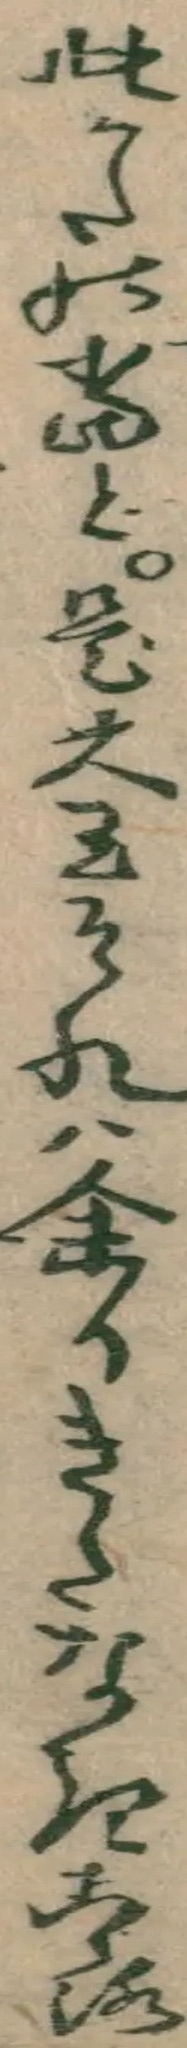此かたの当と。是大王それは余りきたなきこゝろ
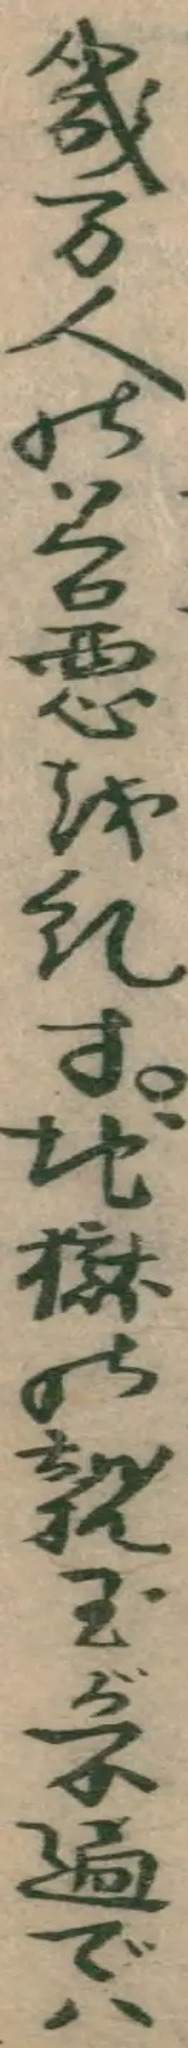幾万人の善悪を糺す。地獄の親玉が不適では
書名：翻草盲目
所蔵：国立国会図書館 National Diet Library, JAPAN
